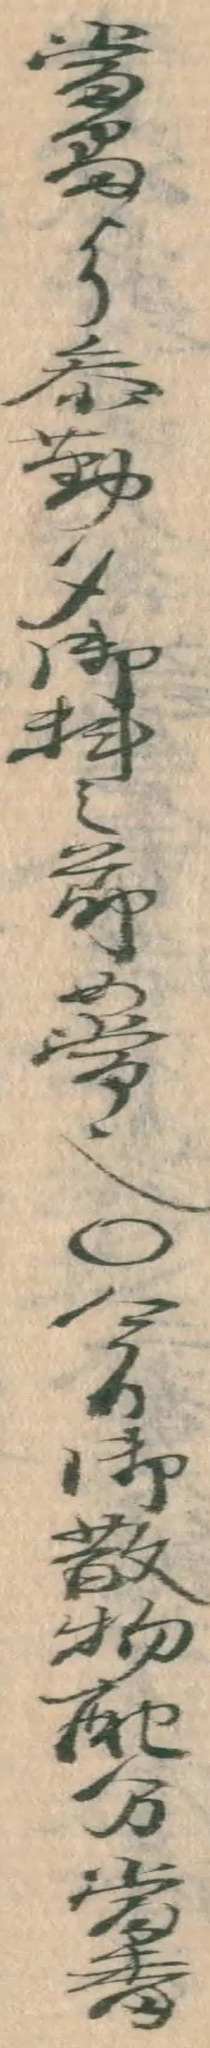當番より参勤夕御料之節如常也○今日御散物配分當番
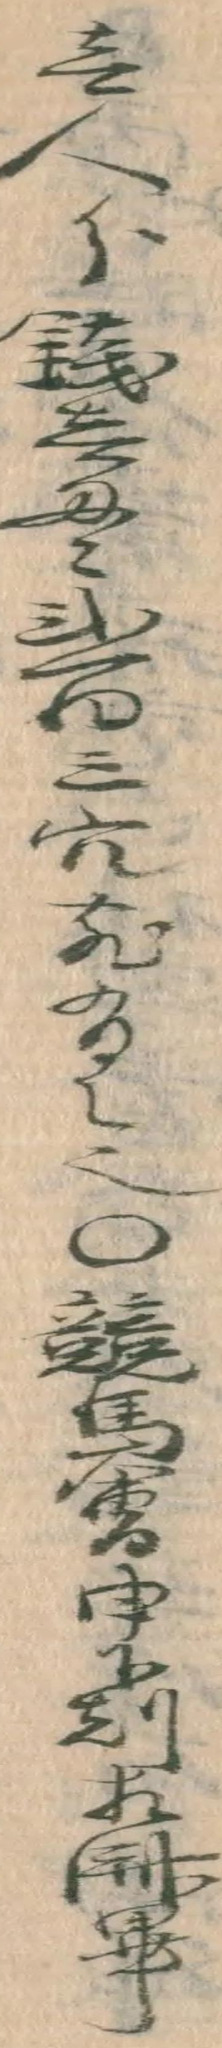壱人分銭壱貫弐百三穴宛有之也〇競馬會申下刻相済畢
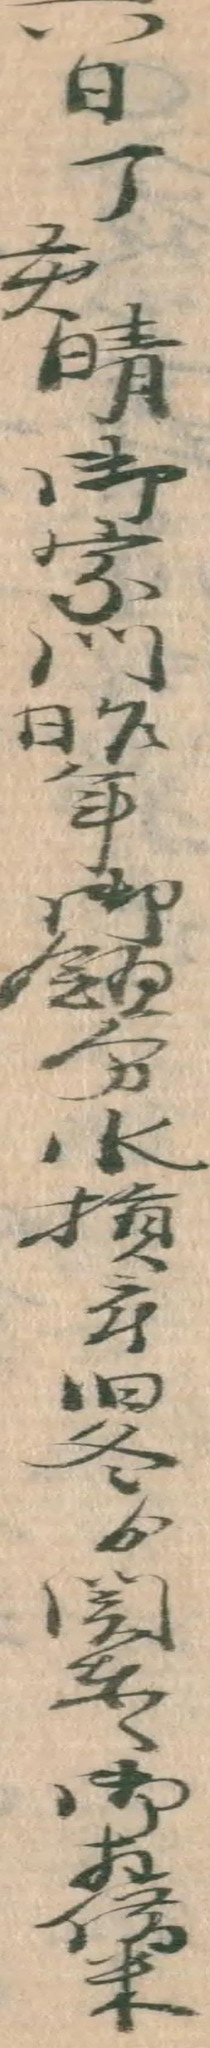六日丁亥晴御家門昨年御領分水損ニ付旧冬ゟ関東へ御拝借米
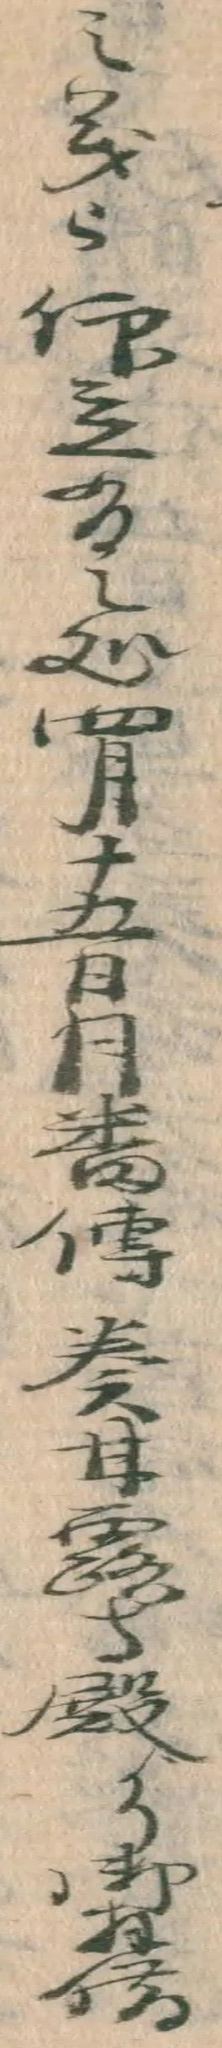之義被仰立有之処四月十五日月番傳奏甘露寺殿より御拝借
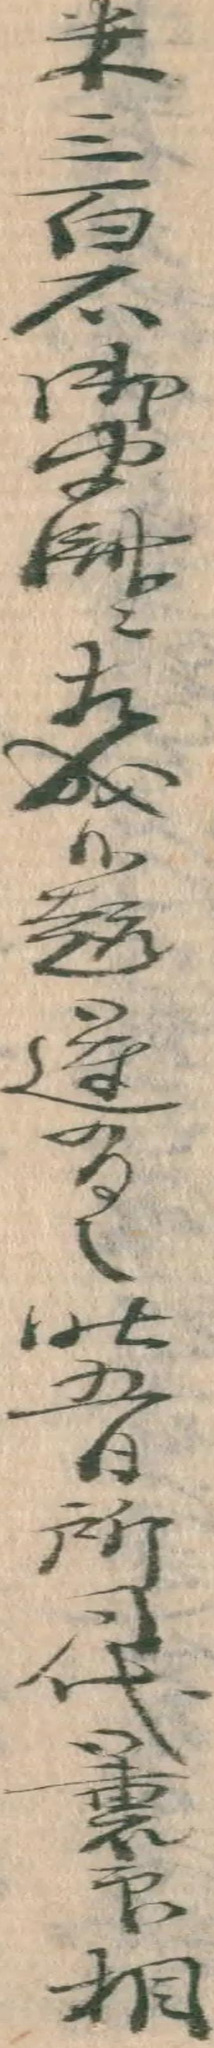来三百石御聞済に相成候趣御達有之昨五日所司代御裏印相
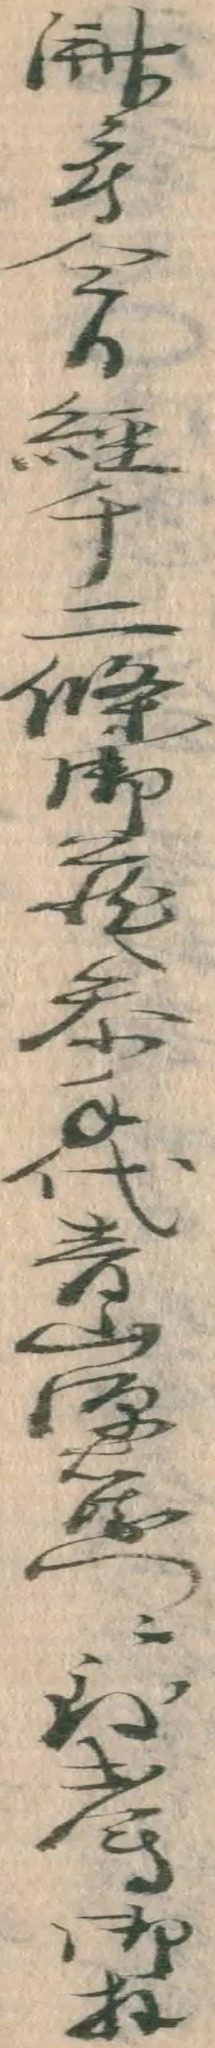済ニ付今日経千二條御蔵へ参手代青山源右衛門ニ致出會御拝
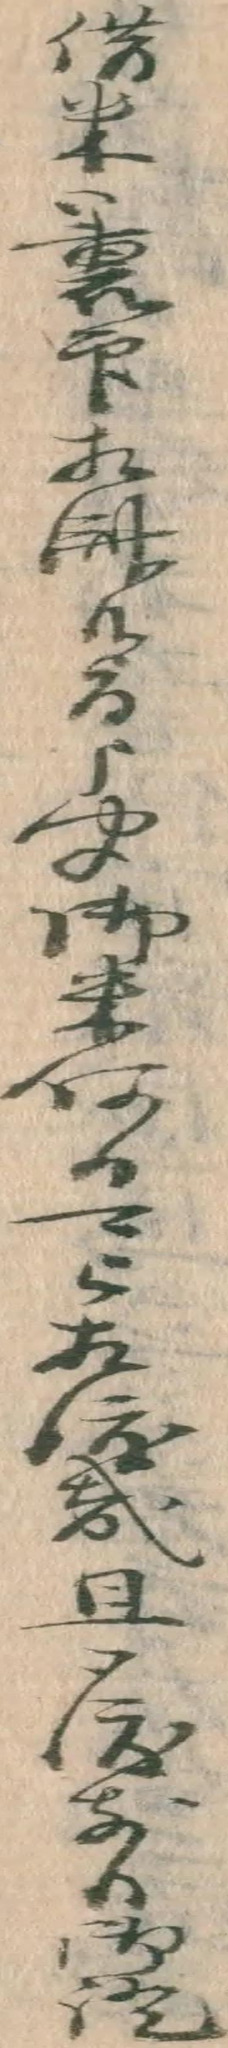借米御裏印相済候旨申聞御米何日可被相渡哉且御渡前日御證
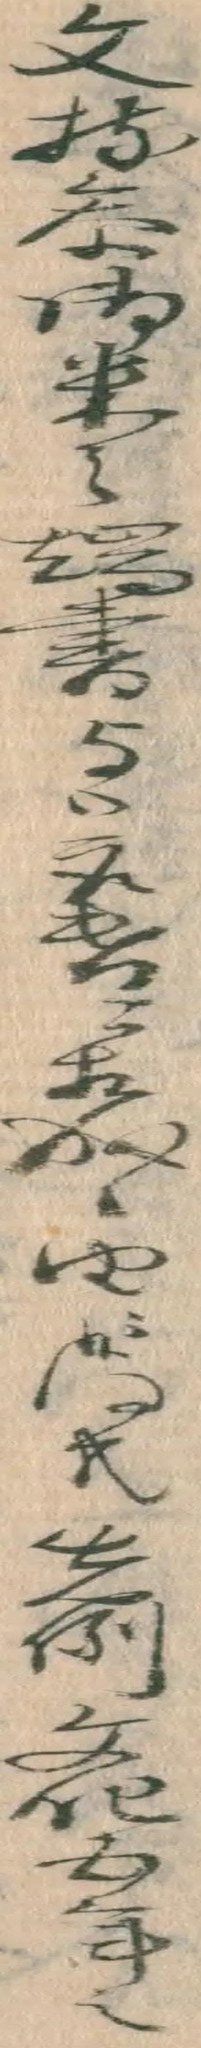文持参御米之端書与御取替二相成候由ニ候得共先例文化五年之
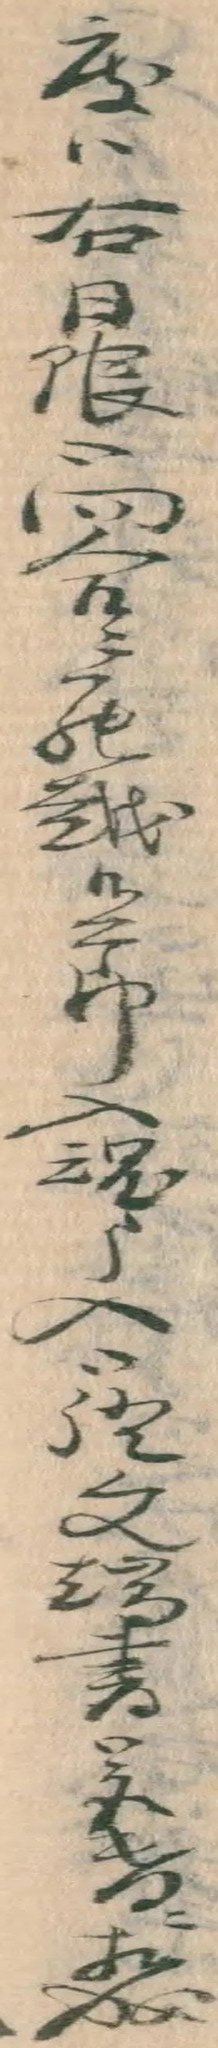度ハ右日限御問合に罷越候節入魂申入御證文端書御承替に相成候
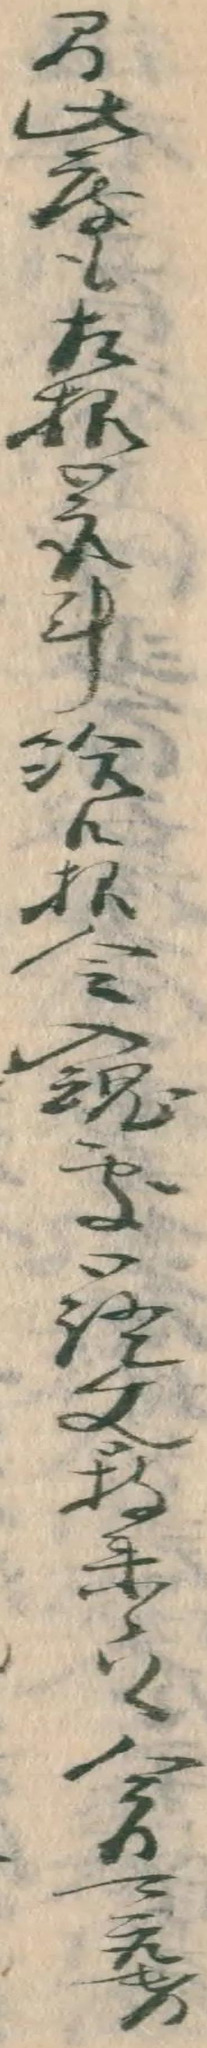間此度も左様御取斗給候様合入魂處御詫文御持参候ハヽ今日可取者
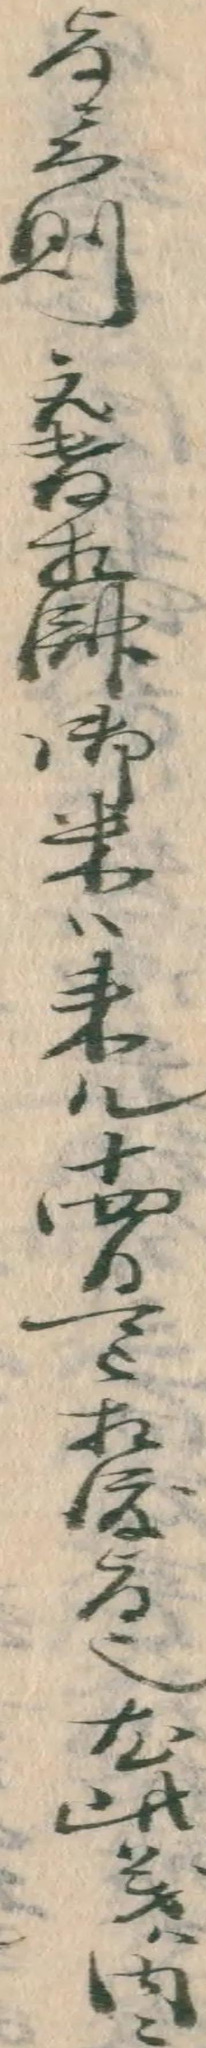旨ニ而則取替相済御米ハ来ル十四日可被相渡旨也尤此義ハ内々
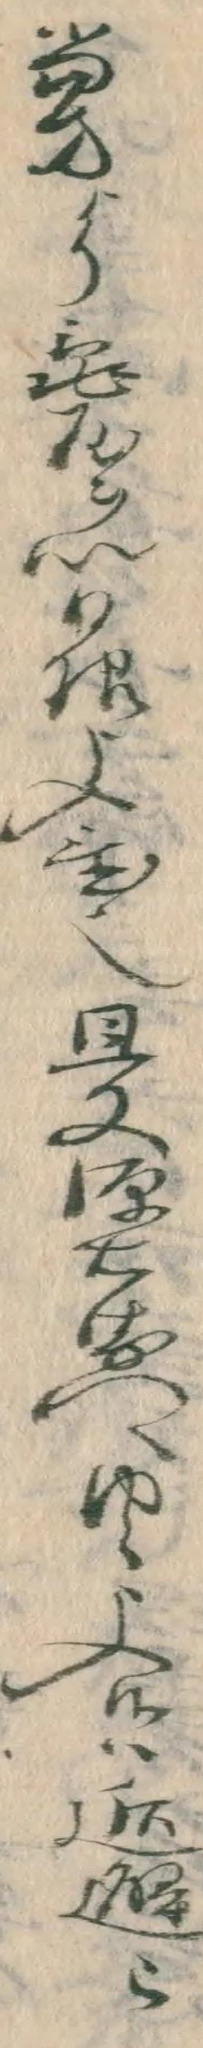當方より亀屋ヲ以日限申入置候且又源右衛門へ内々申入候ハ近連被
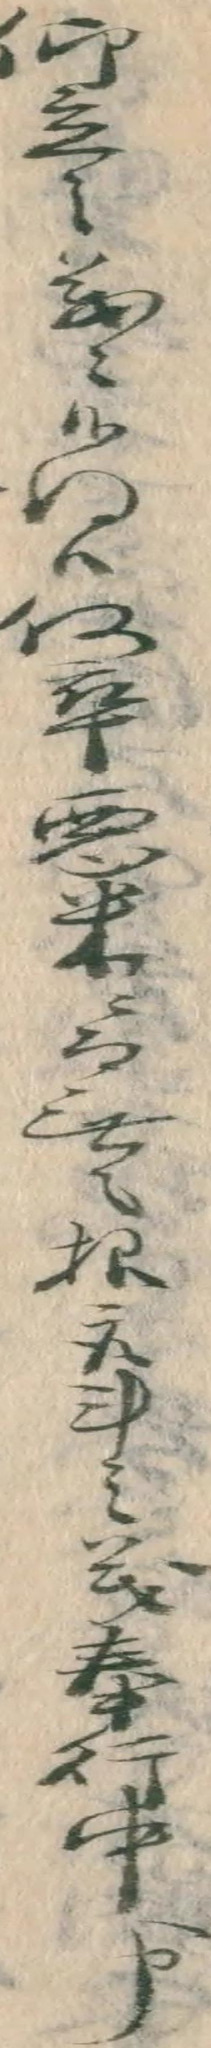仰立之義ニ候得ハ何卒悪米ニ而無之様取斗之義奉行中へ申
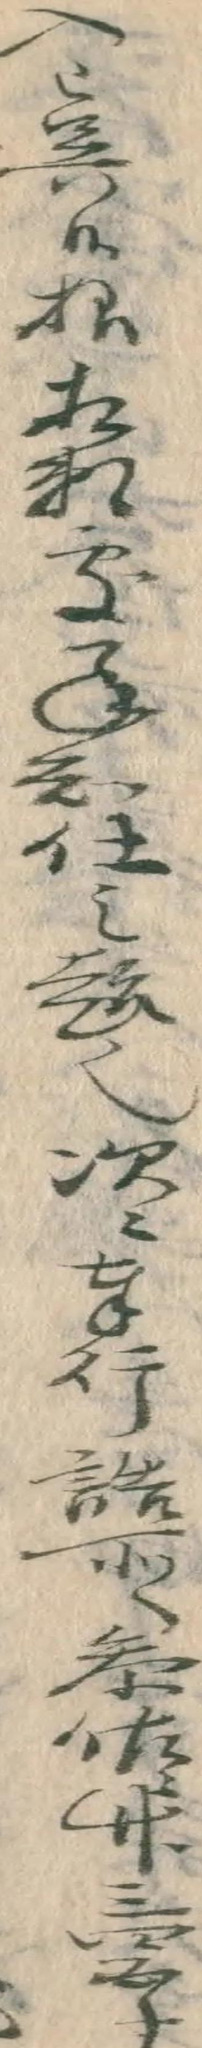入被呉候様相頼處承知仕之趣也次ニ奉行詰所へ参佐竹三四郎
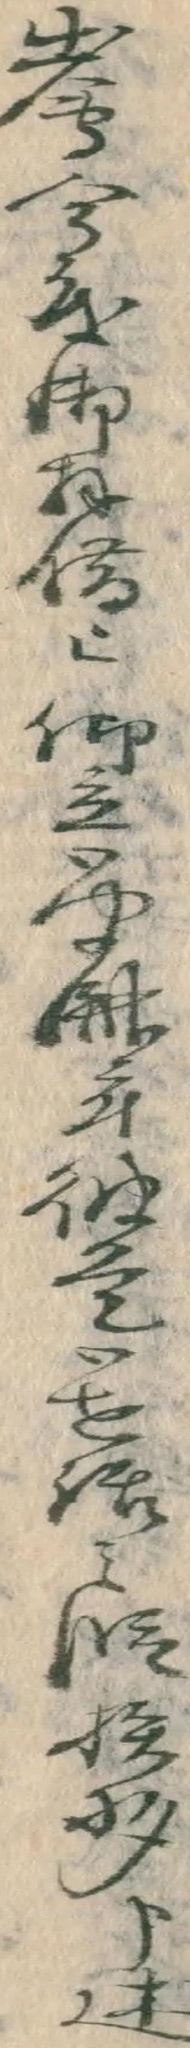出會今度御拝借被仰立御聞済ニ付彼是御世話之段挨拶申述
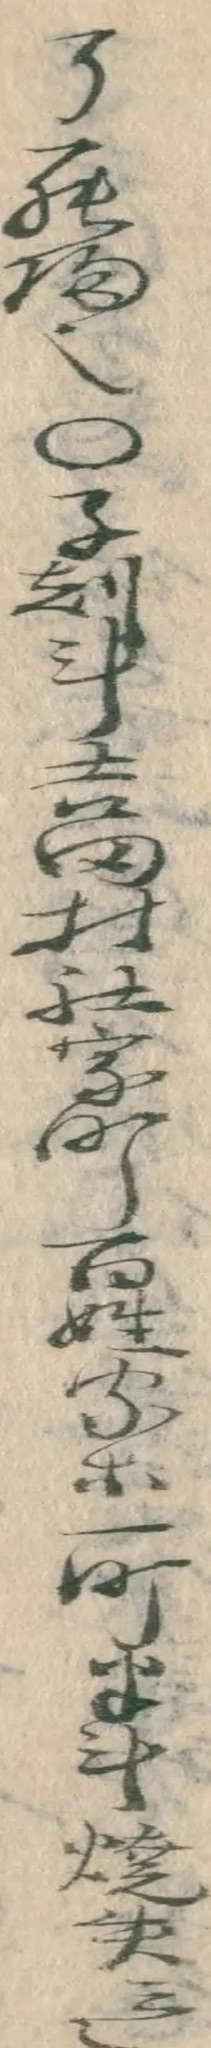了罷帰也○子刻斗吉田村社家町百姓家等一町半斗焼失云〻
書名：賀茂社記録. 第65冊
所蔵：国立国会図書館 National Diet Library, JAPAN
